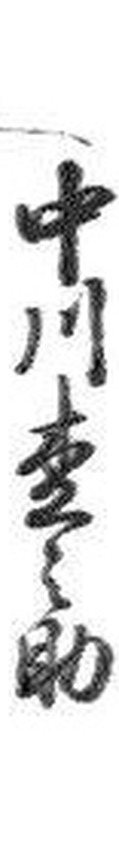中川杢之助
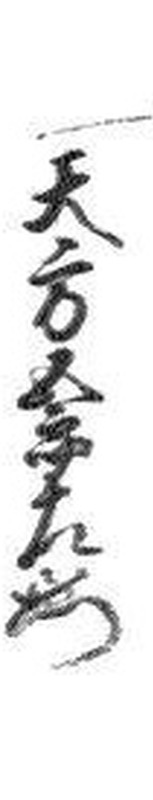天方五郎左衛門
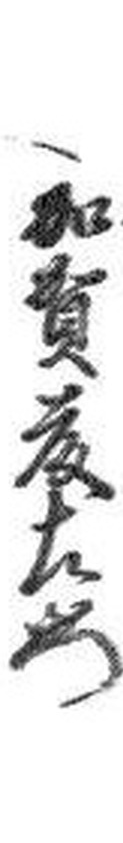加賀藤左衛門
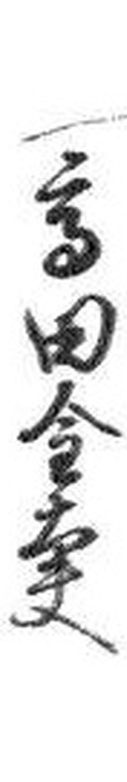高田金太夫
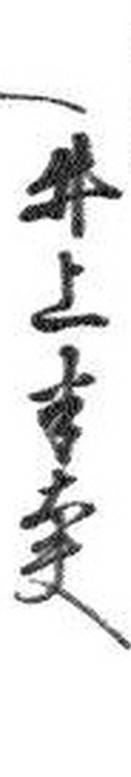井上半太夫
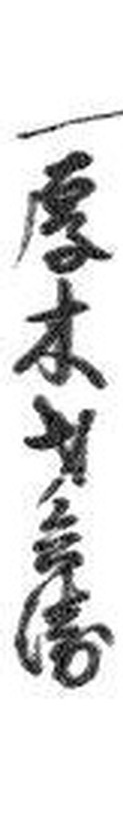厚木才兵衛
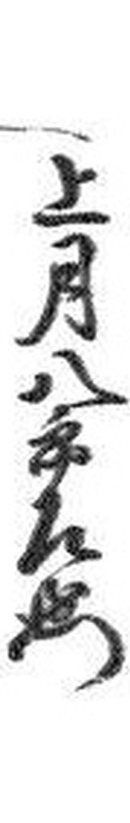上月八郎左衛門
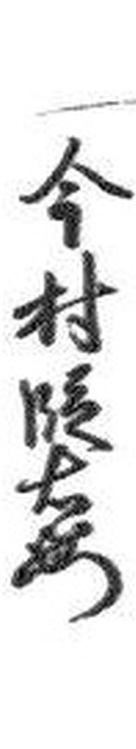今村段右衛門

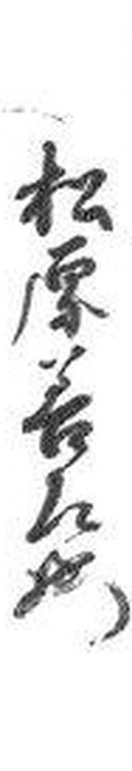松原善左衛門
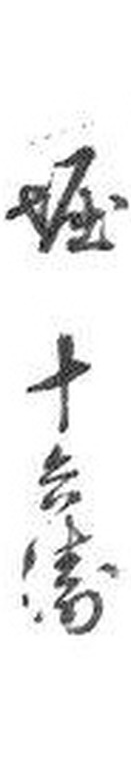堀十兵衛
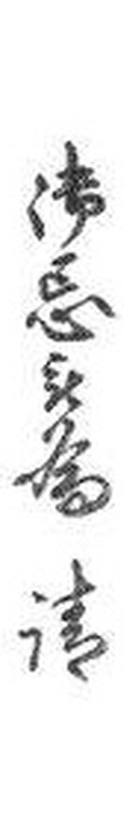御忌被為請
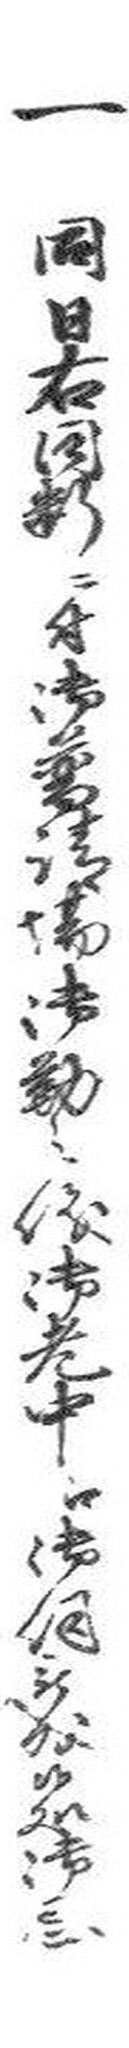一同日右同断ニ付御普請場御勤之儀御老中江御伺被成候処御忌
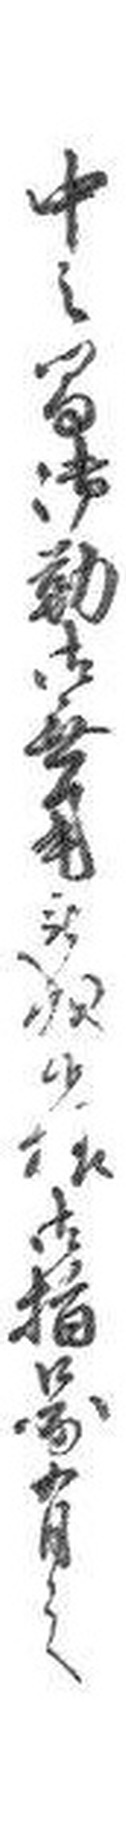中之間御勤御無用被成候様被指図有之
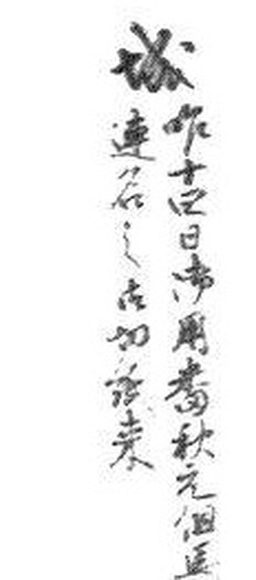連名之御切紙来
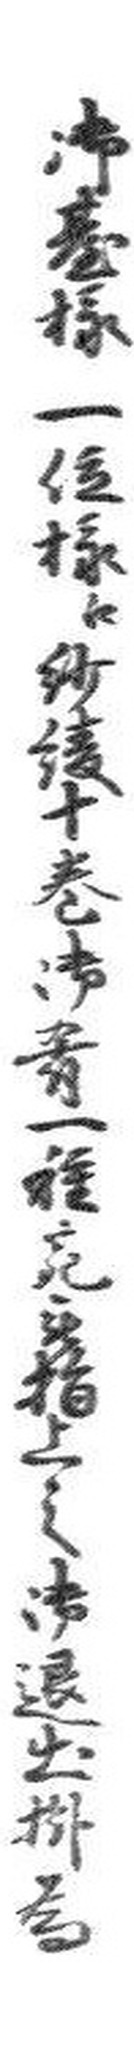御台様一位様江紗綾十巻御肴一種宛被指上之御退出掛為
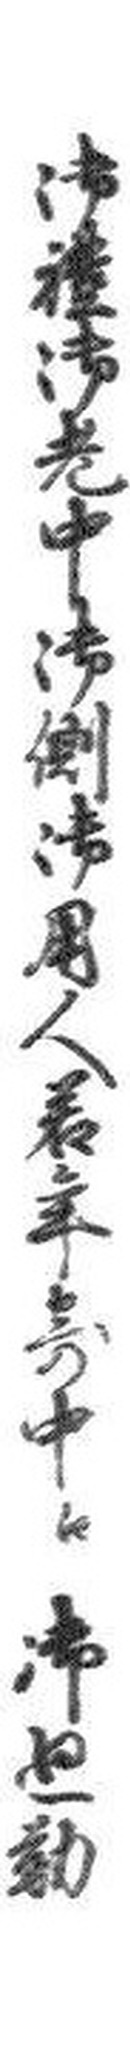御礼御老中御側御用人若年寄中江御廻勤
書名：家譜 二十三 吉品公 従宝永元年到同二年
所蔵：福井県文書館 Fukui Prefectural Archives
